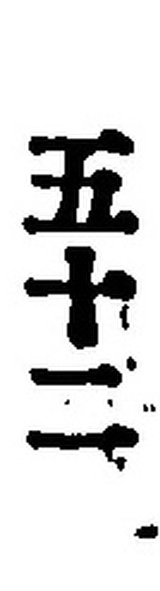五十二
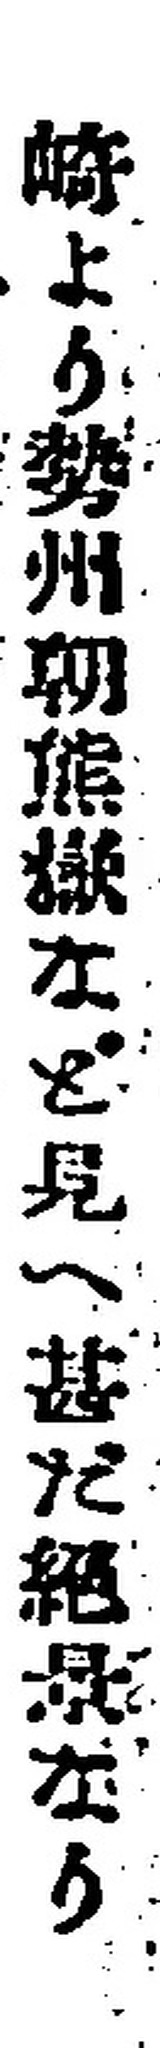崎より勢州朝熊嶽など見へ甚だ絶景なり
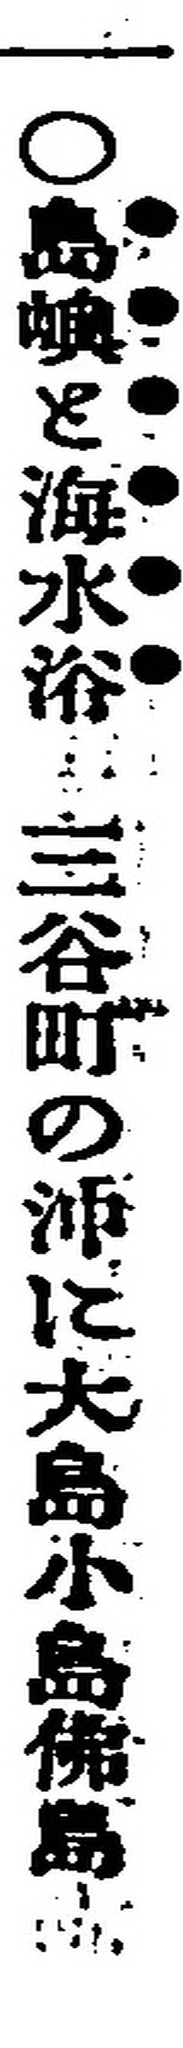○島嶼と海水浴三谷町の沖に大島小島仏島
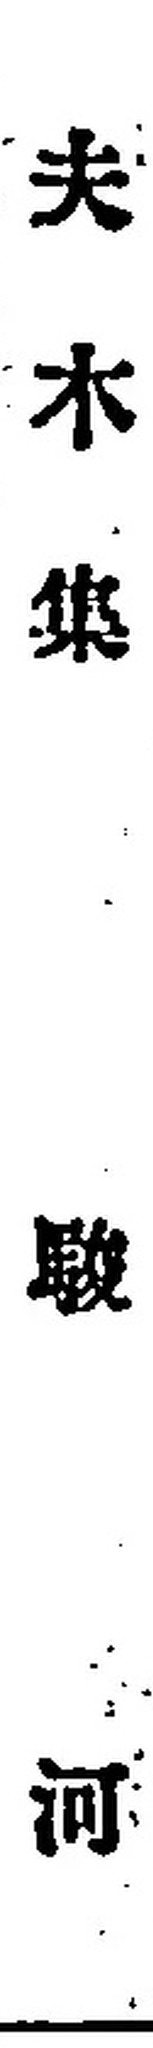夫木集駿河
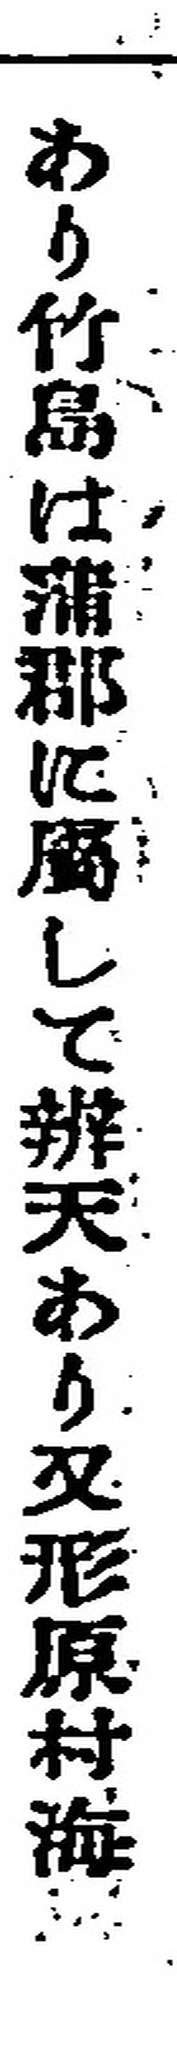あり竹島は蒲郡に属して弁天あり又形原村海
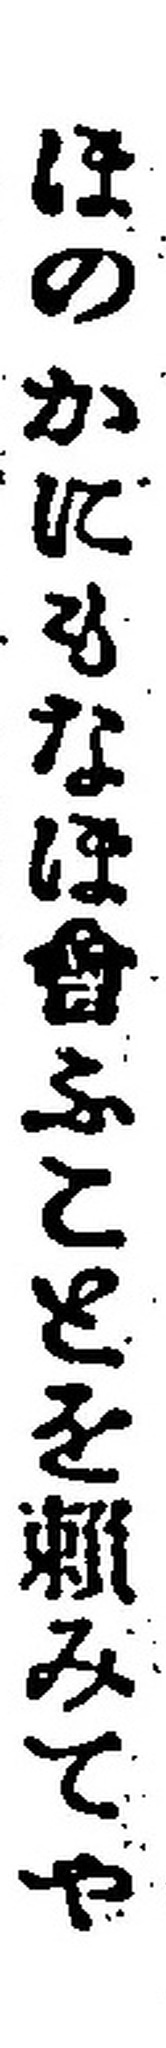ほのかにもなほ会ふことを頼みてや
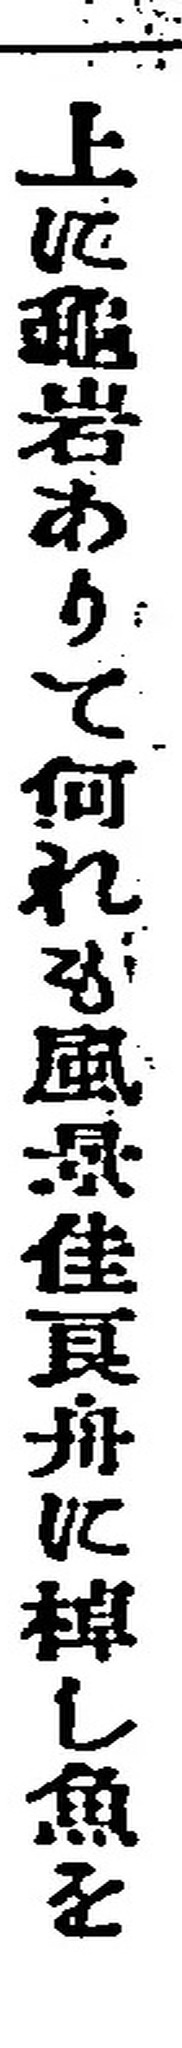上に亀岩ありて何れも風景佳良舟に棹し魚を
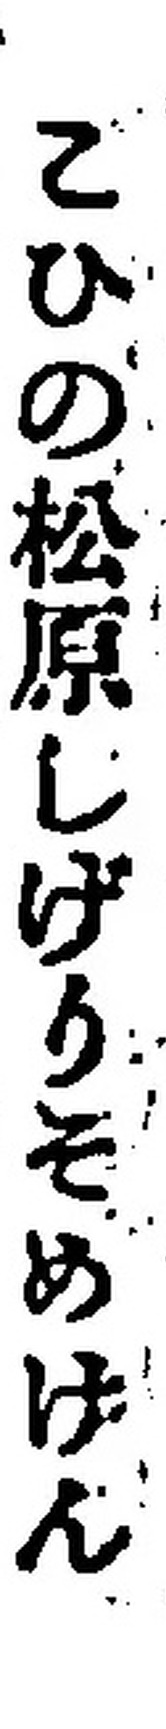こひの松原しげりそめけん
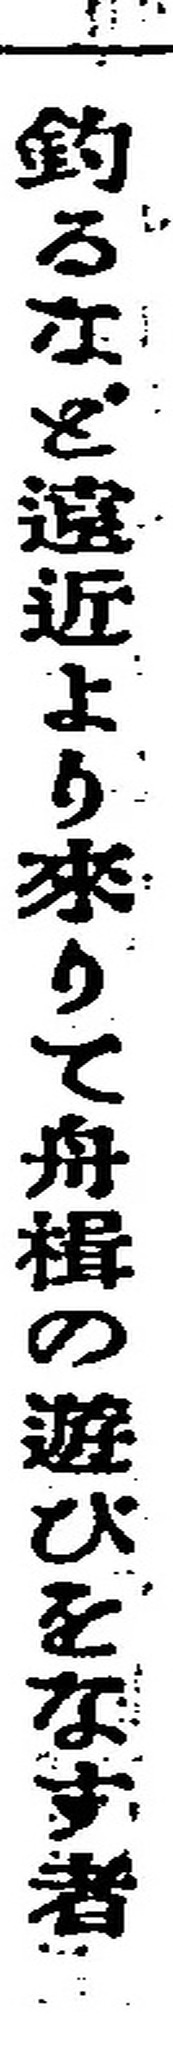釣るなど遠近より来りて舟楫の遊びをなす者
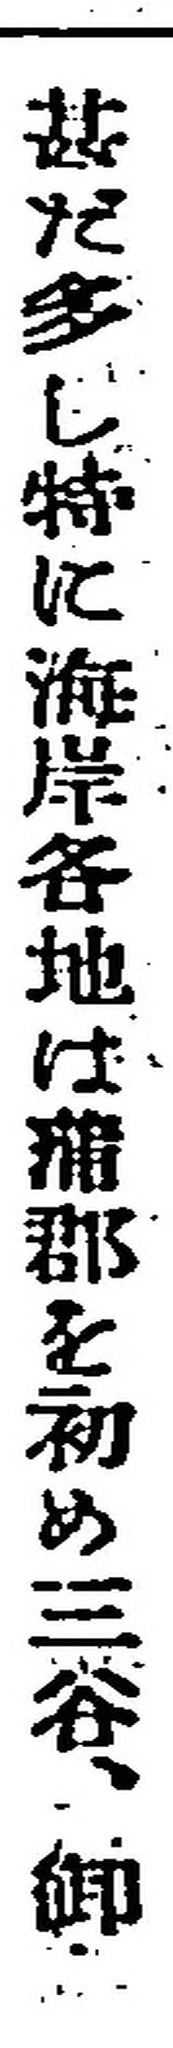甚だ多し特に海岸各地は蒲郡を初め三谷、御
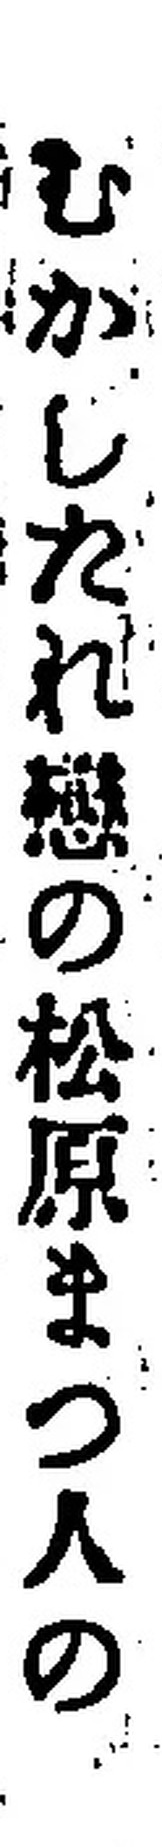むかしたれ恋の松原まつ人の
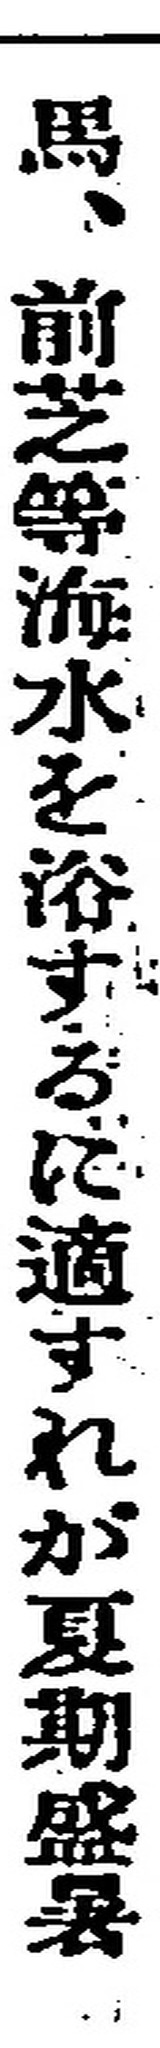馬、前芝等海水を浴するに適すれが夏期盛暑
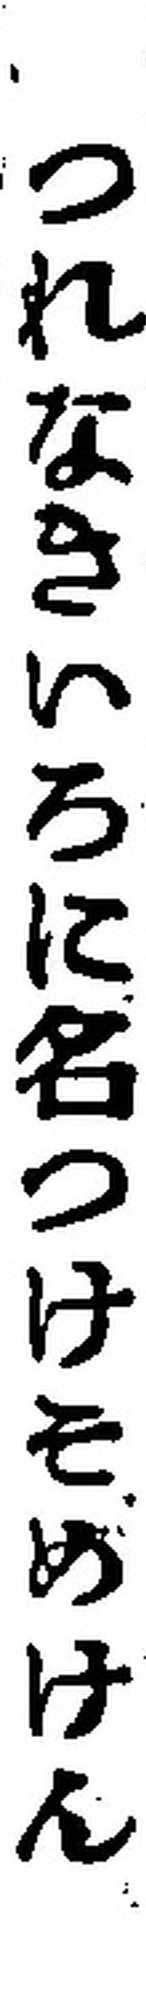つれなきいろに名つけそめけん
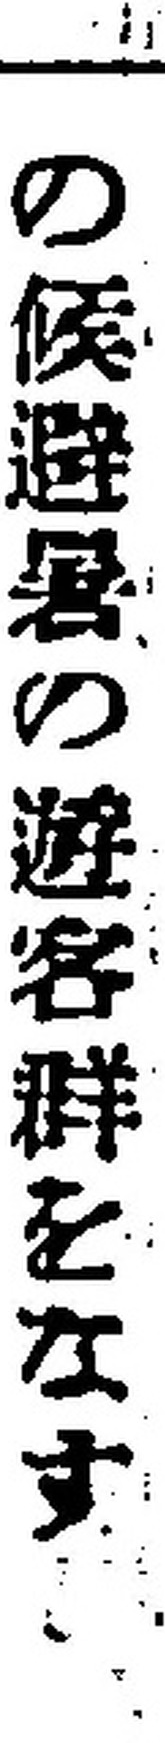の候避暑の遊客群をなす
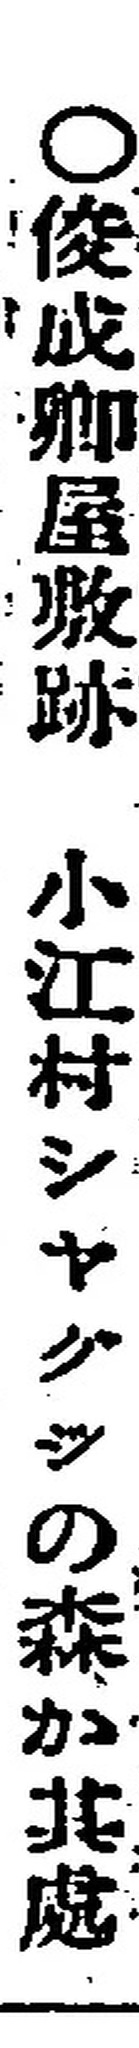○俊成卿屋敷跡小江村シヤグジの森か其処
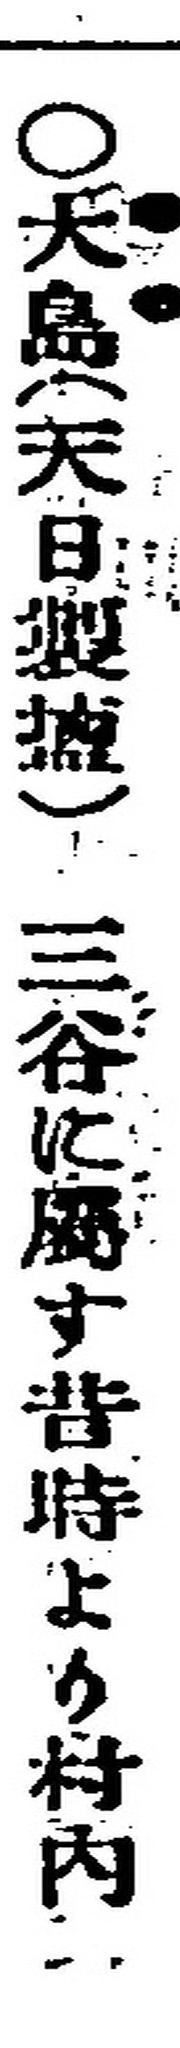○大島(天日製塩)三谷に属す昔時より村内
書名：東参名勝案内
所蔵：国立国会図書館 National Diet Library, JAPAN
